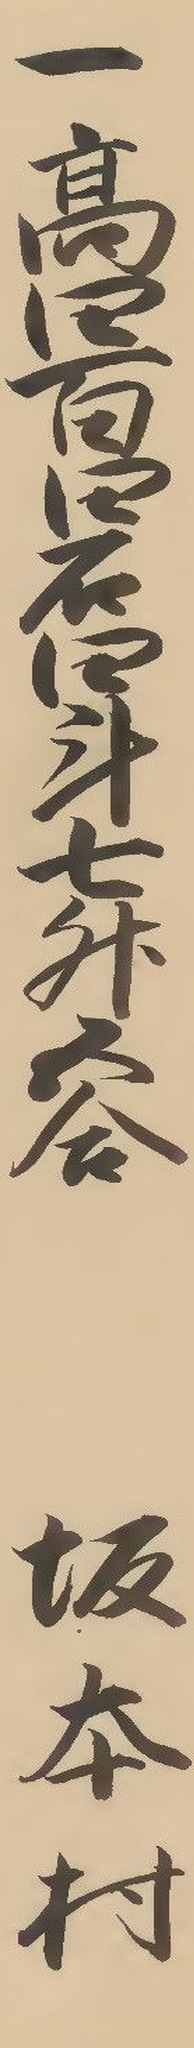一高四百四石四斗七升五合坂本村
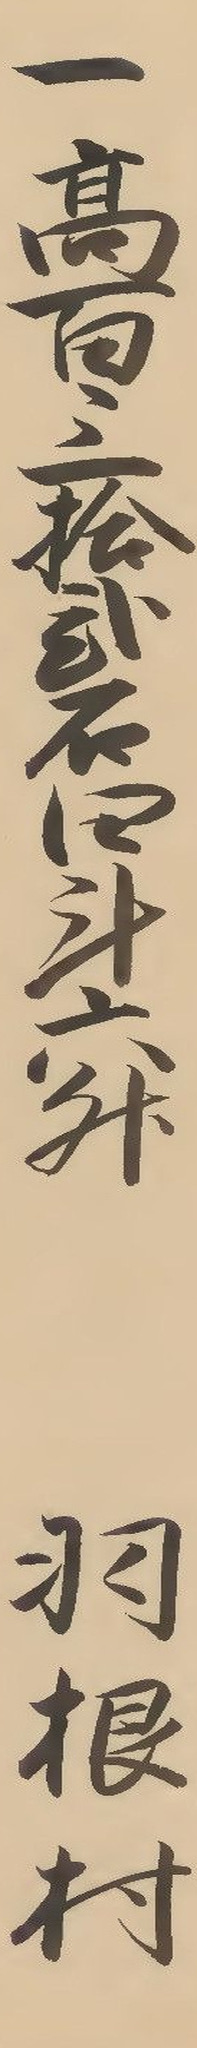一高三拾弐石四斗六升羽根村
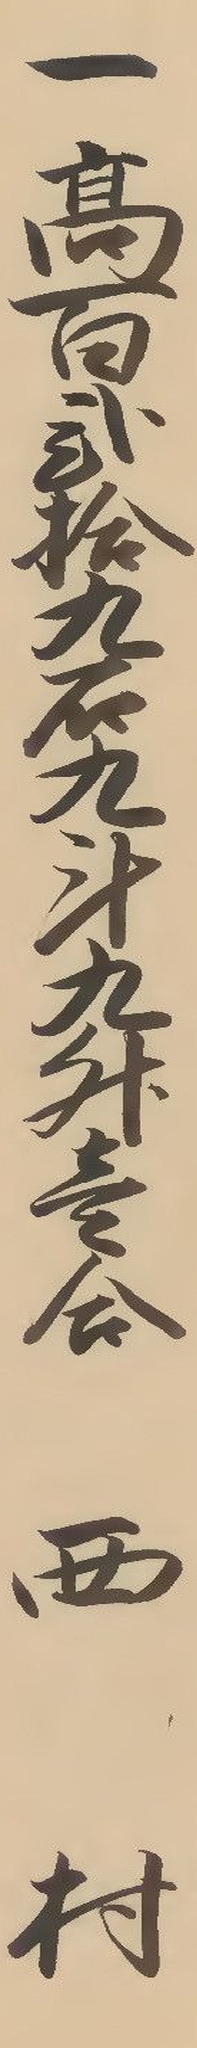一高百弐拾九石九斗九升壱合西村
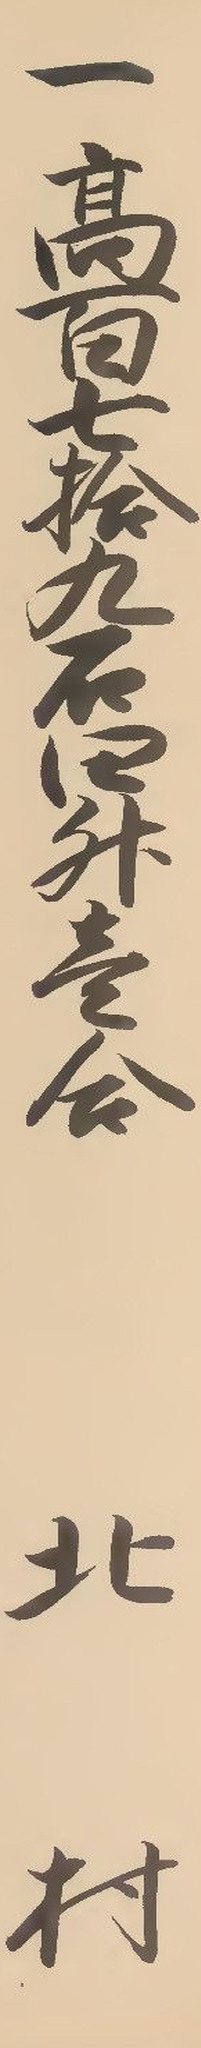一高百七拾九石四升壱合北村
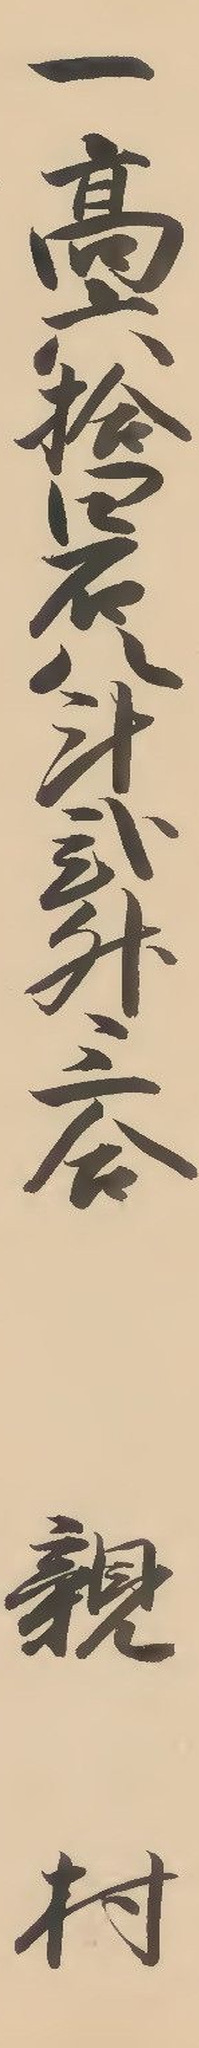一高六拾四石八斗弐升三合親村
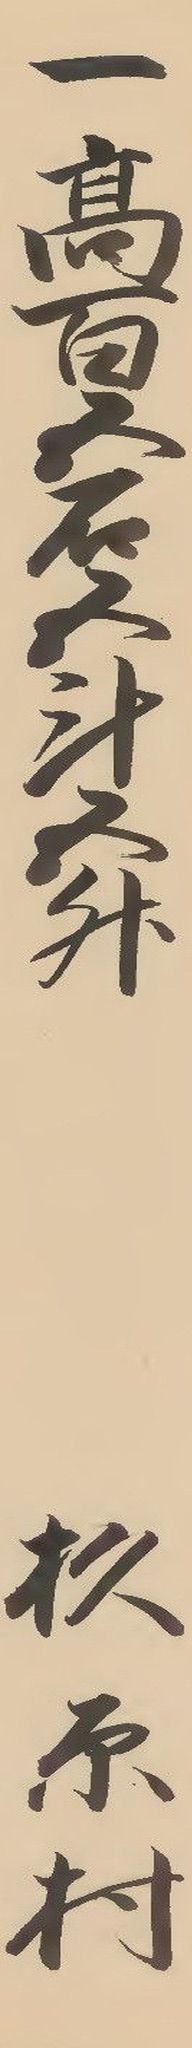一高百五石五斗五升杉原村
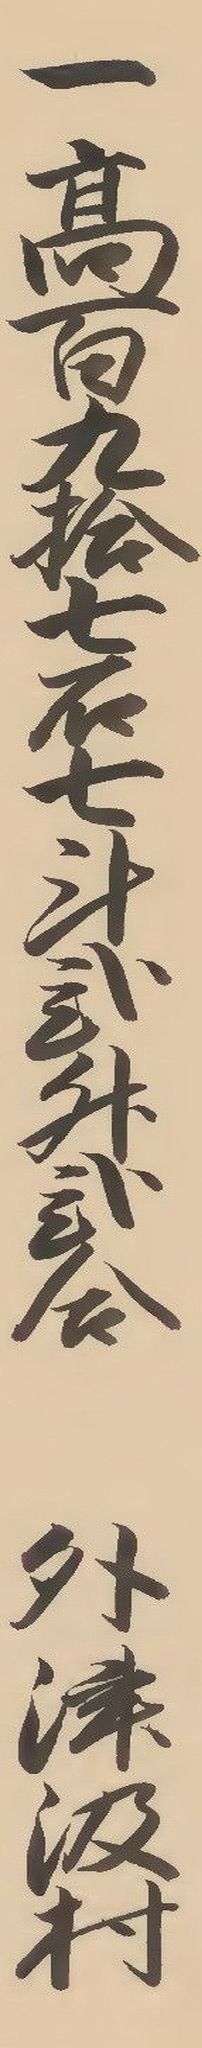一高百九拾七石七斗弐升弐合外津汲村

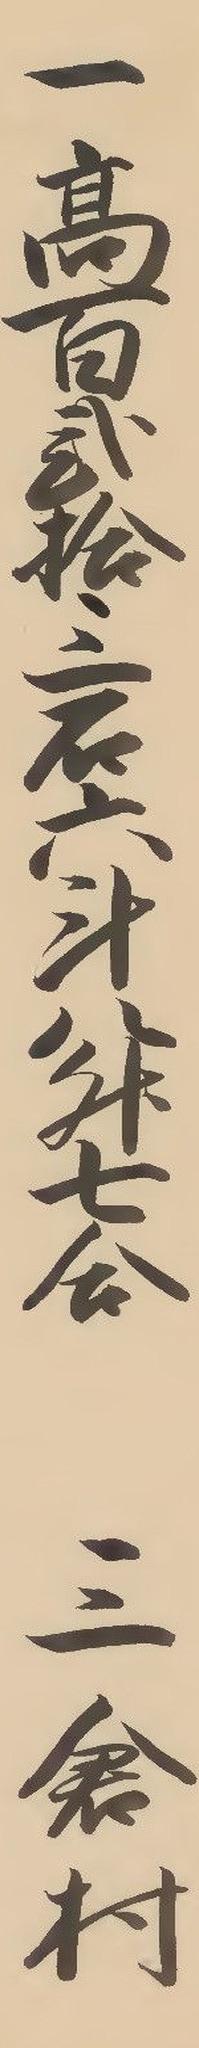一高百弐拾三石六斗八升七合三倉村
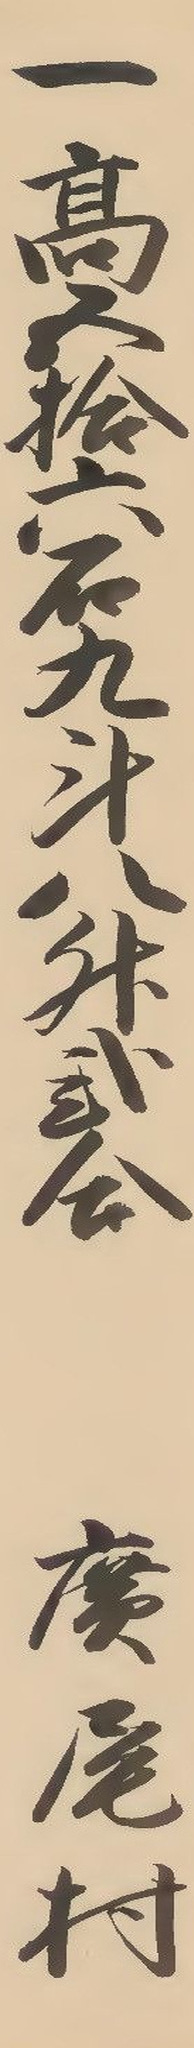一高五拾六石九斗八升弐合広尾村
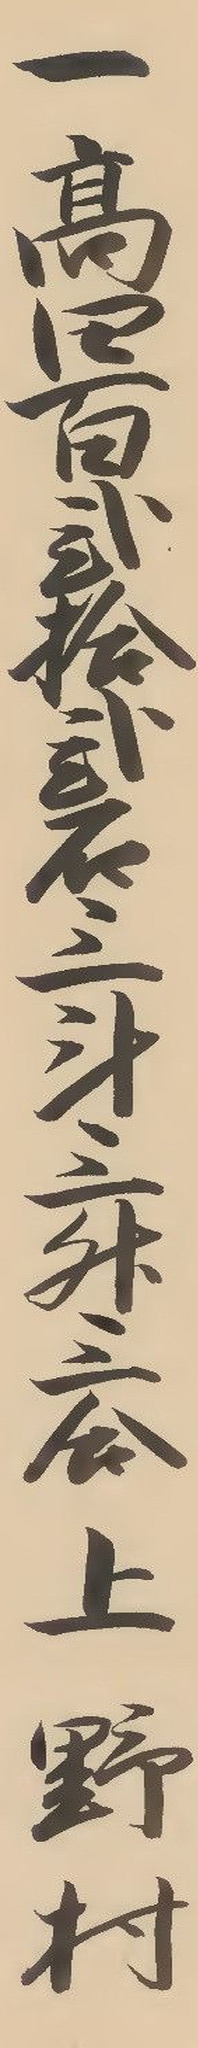一高四百弐拾弐石三斗三升三合上野村
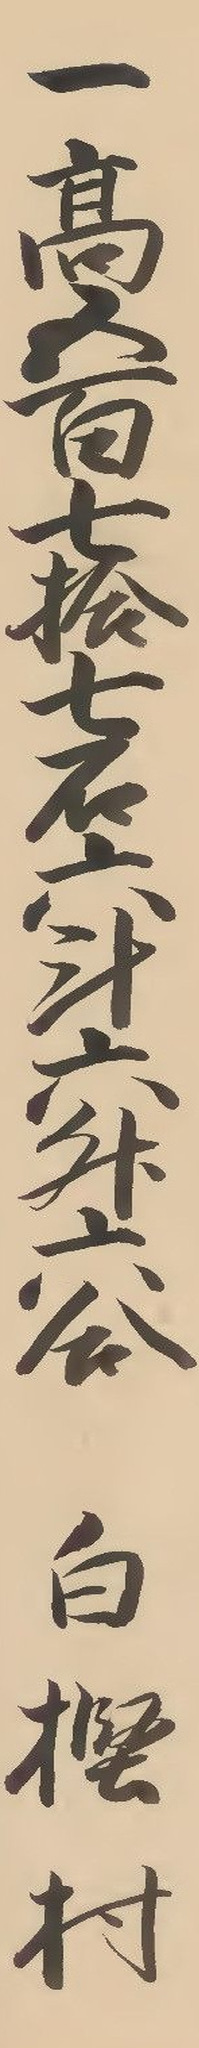一高五百七拾七石六斗六升六合白樫村
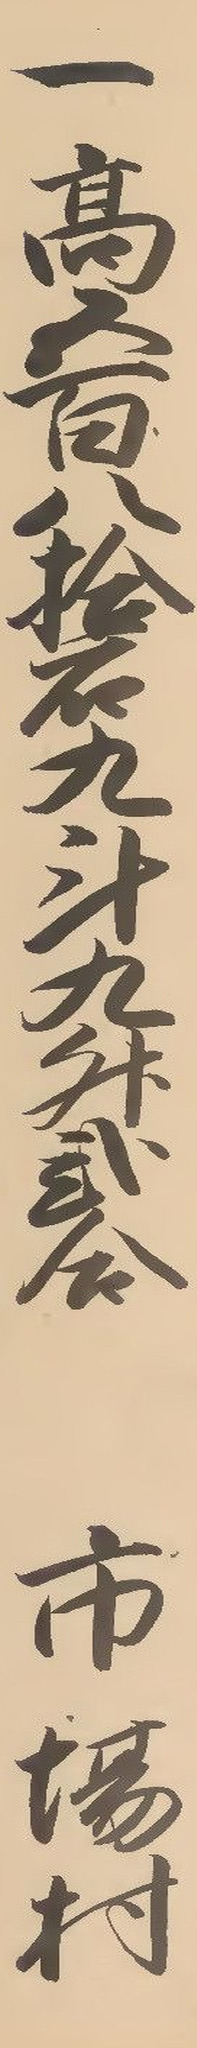一高五百八拾石九斗九升弐合市場村
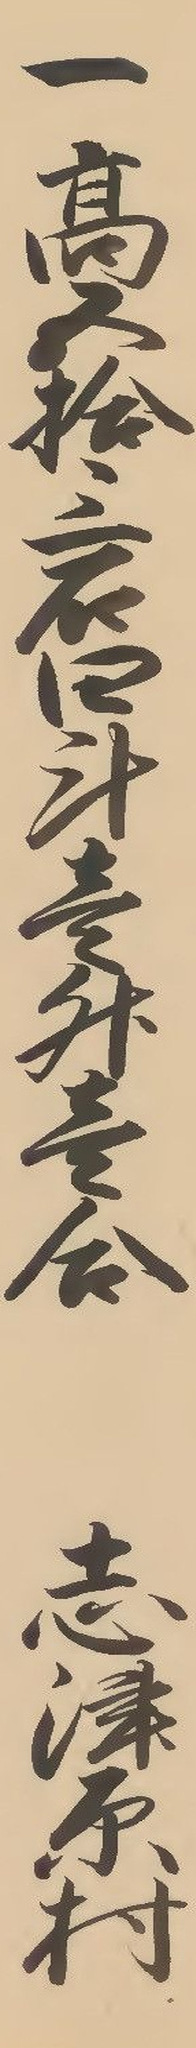一高五拾三石四斗壱升壱合志津原村
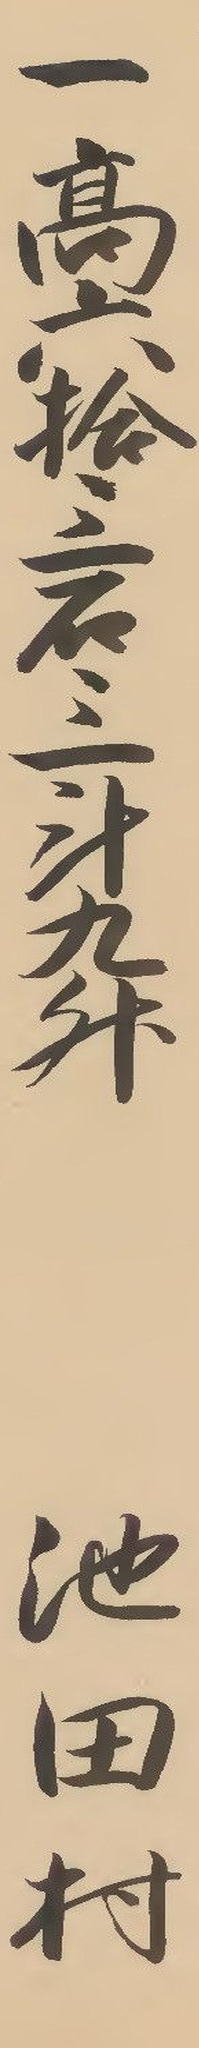一高六拾三石三斗九升池田村
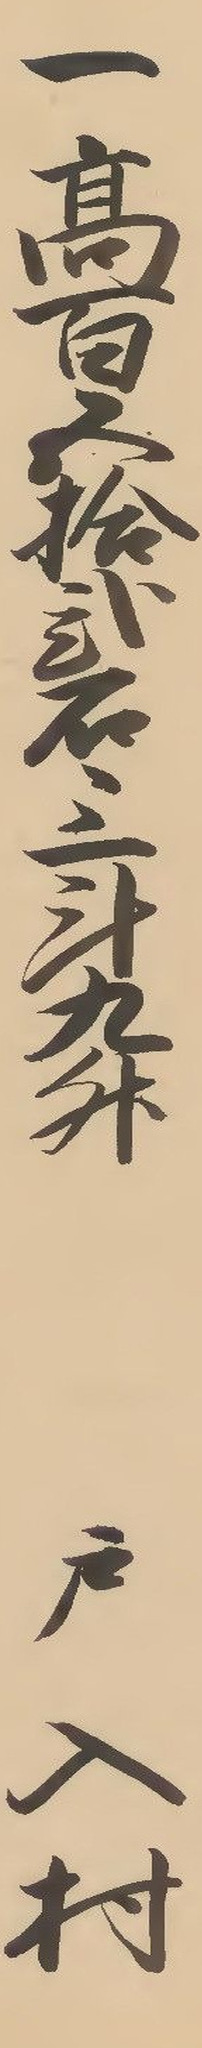一高百五拾弐石三斗九升戸入村

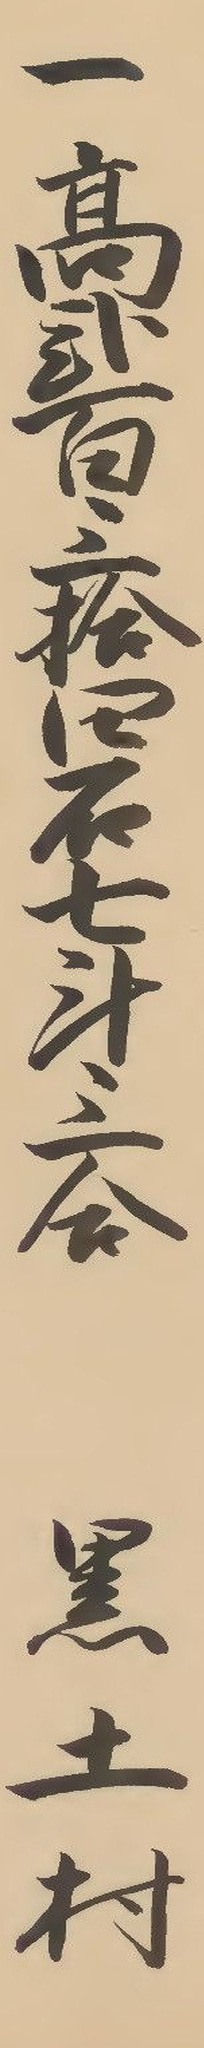一高弐百三拾四石七斗三合黒土村
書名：美濃国郷帳
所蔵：国立公文書館 National Archives of Japan
